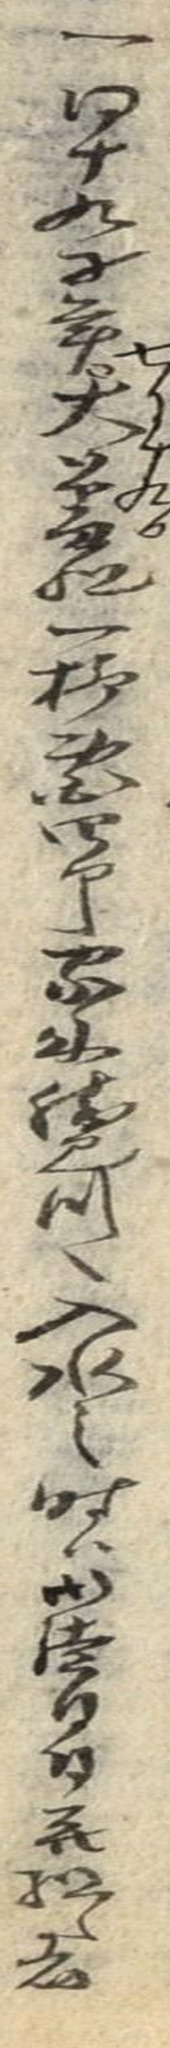一同十九刁年◦大御番七月十九日組一柳団四郎家来勝見川へ入水之時は御徒目付并組之者
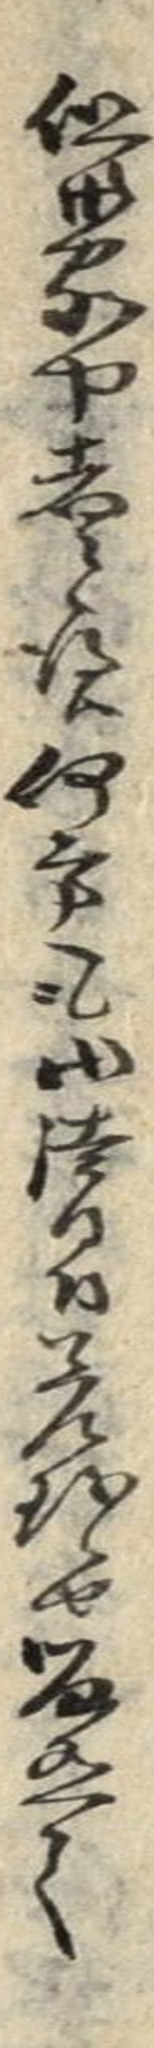但御家中者に候得は何方へも御徒目付差越候由留有之

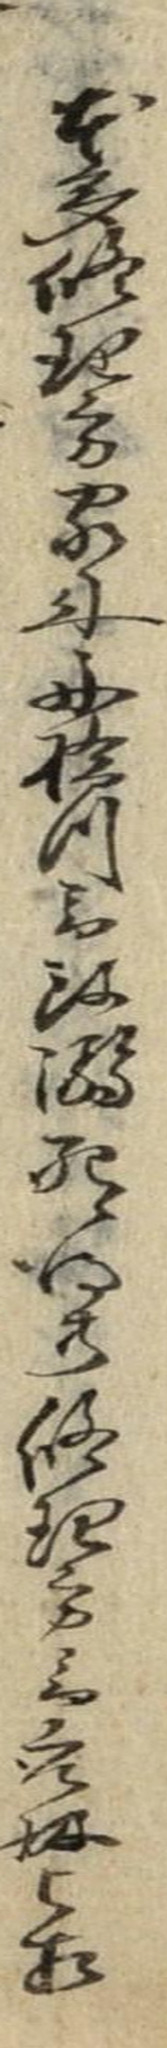一本多修理方家来舟橋川にて致溺死候得共修理方にて取扱被相
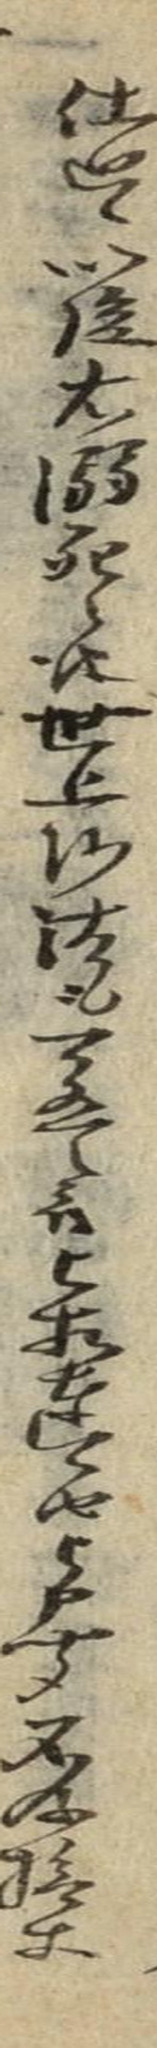仕廻候以後右溺死之儀世上沙汰も可有之に付被相達候由被申聞不及検使
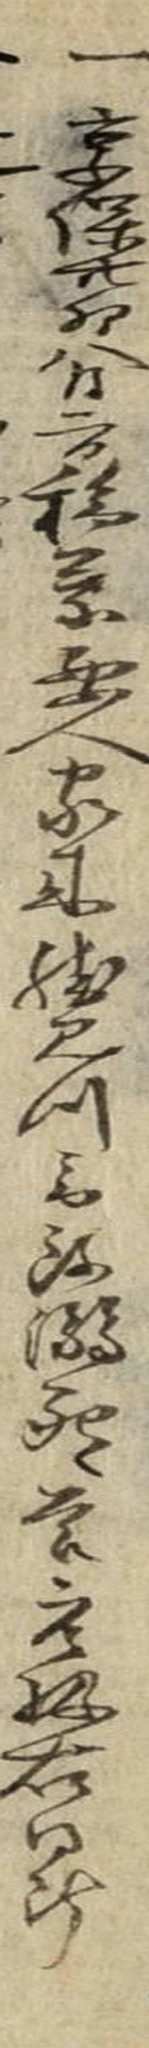一享保廿卯八月二日稲葉要人家来勝見川にて致溺死候節取扱右同断
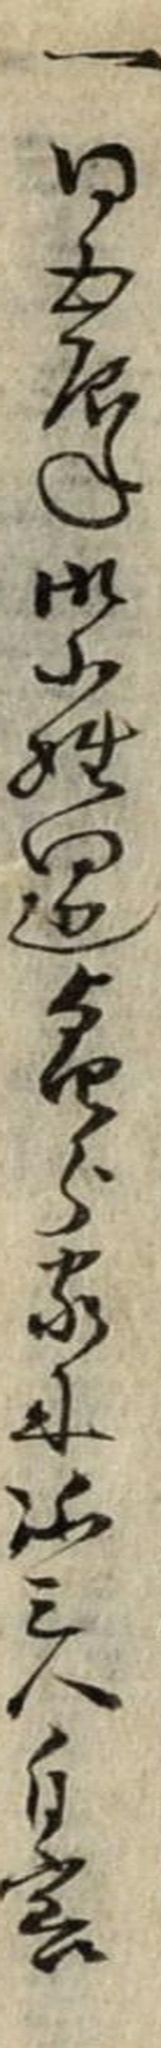一同五辰年御小姓田辺与四郎家来弥三八自害
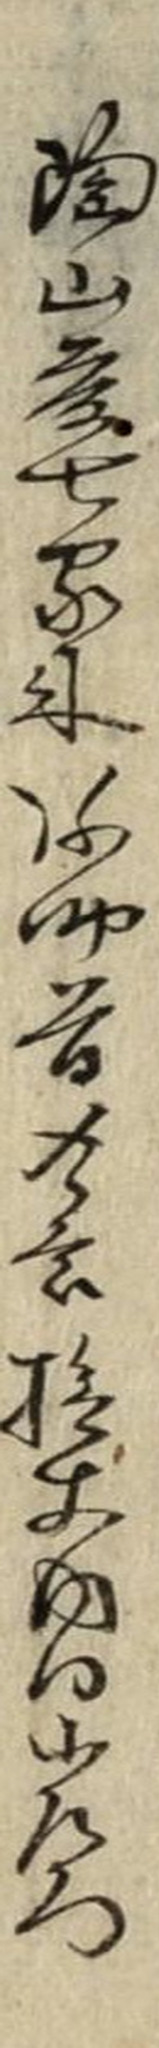陶山藤七家来弥助首〆候節検使内田小左衛門
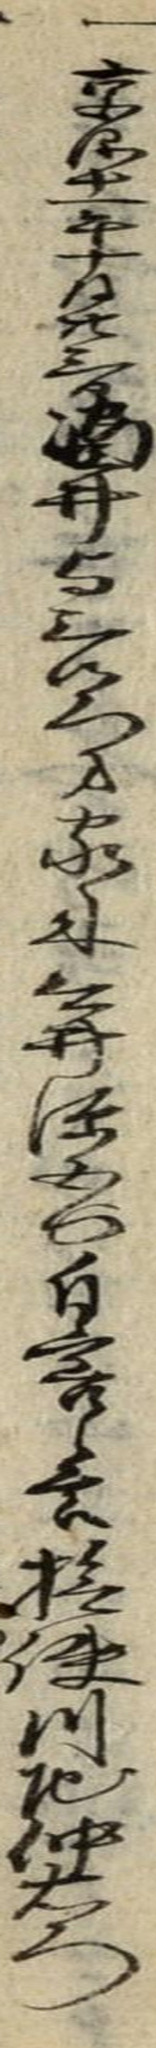一享保十一午十月廿三日酒井与三左衛門方家来今井源五右衛門自害之節検使川地仲右衛門
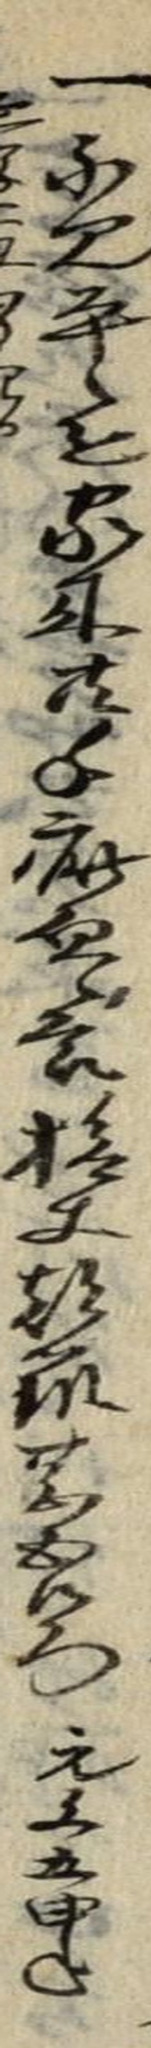一永見平之進家来共手疵負候節検使都筑甚五左衛門元文五申年
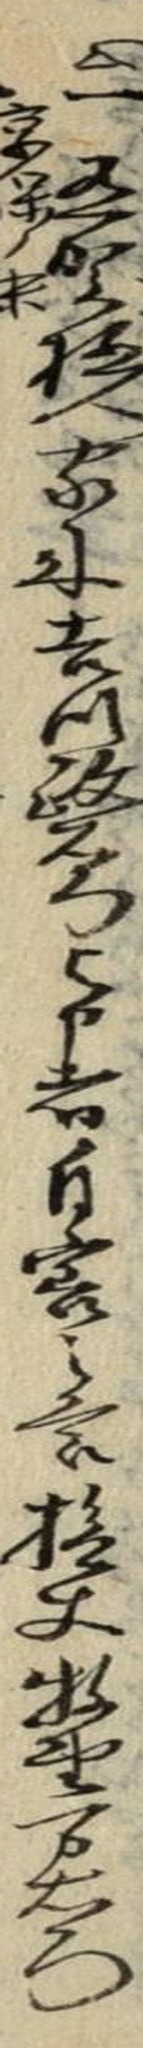△一有賀極人家来吉川政右衛門と申者自害之節検使牧野万右衛門
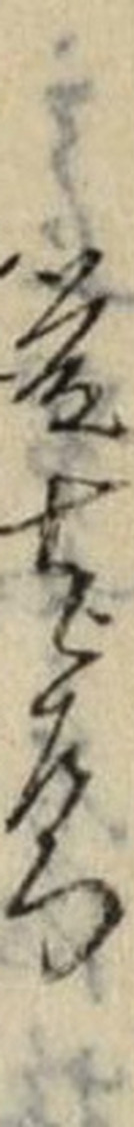藤十郎左衛門
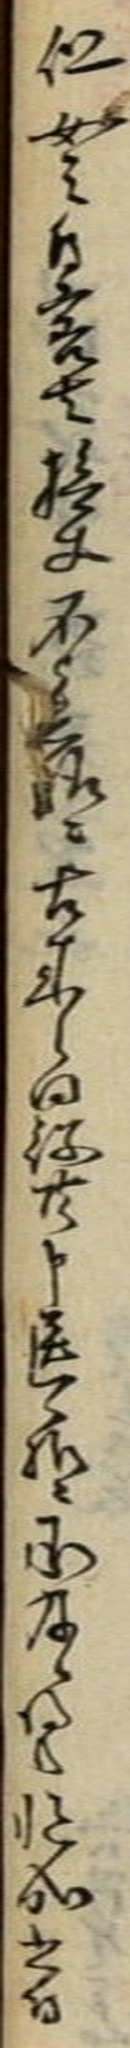但女之自害は検使不被出趣に古来之同役共申送候様に承及候得共慥成書付
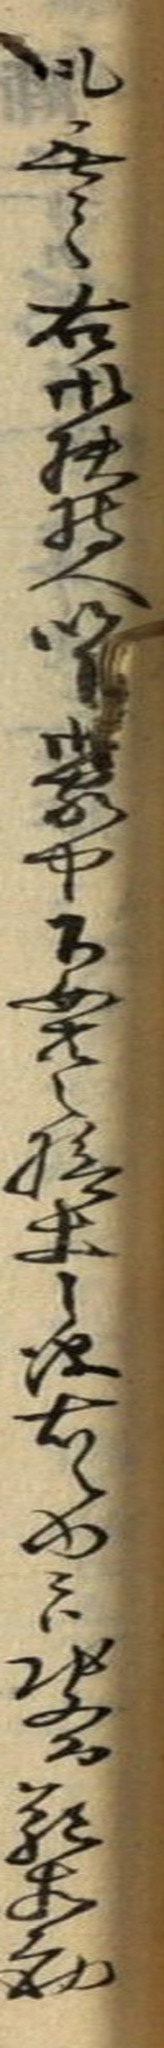も無之右御扶持人以下御家中下女共之検使之儀右之内には決て難相勤
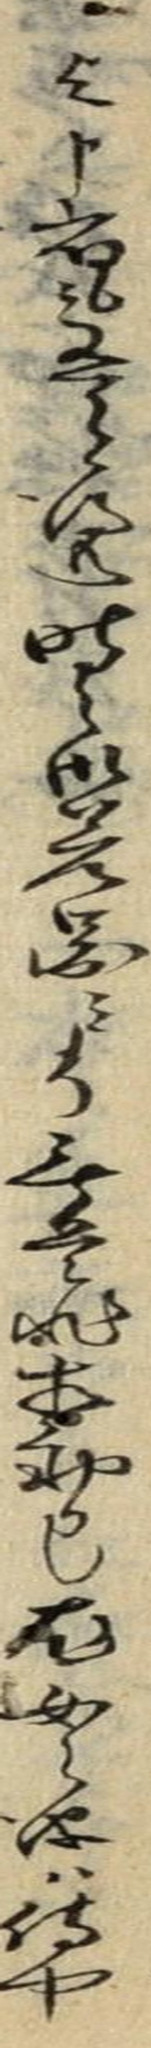と申者も有之候得共時之御差図により無是非相勤申候尤女之儀は侍中
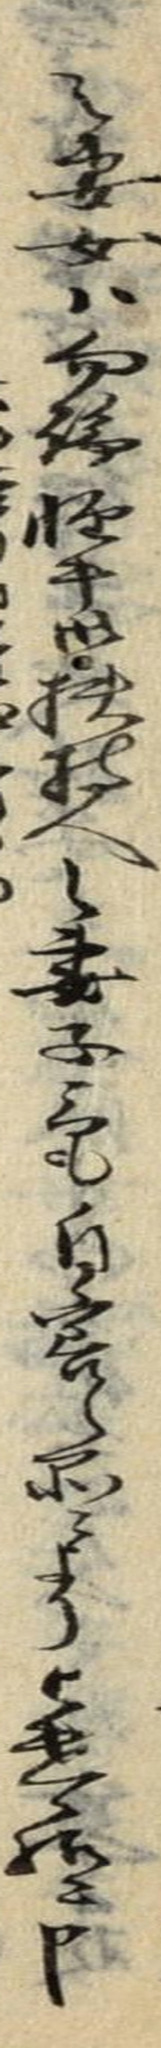之妻女は勿論軽キ御扶持人之妻子にても自害之品により被遣候様に申
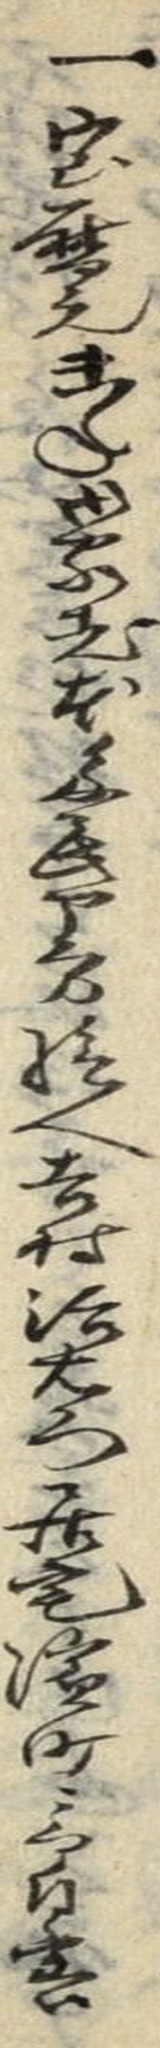一宝暦元未年御家老本多民部方給人吉村治右衛門居宅浜町にて自害
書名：御停止異変死失
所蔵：福井県文書館 Fukui Prefectural Archives
